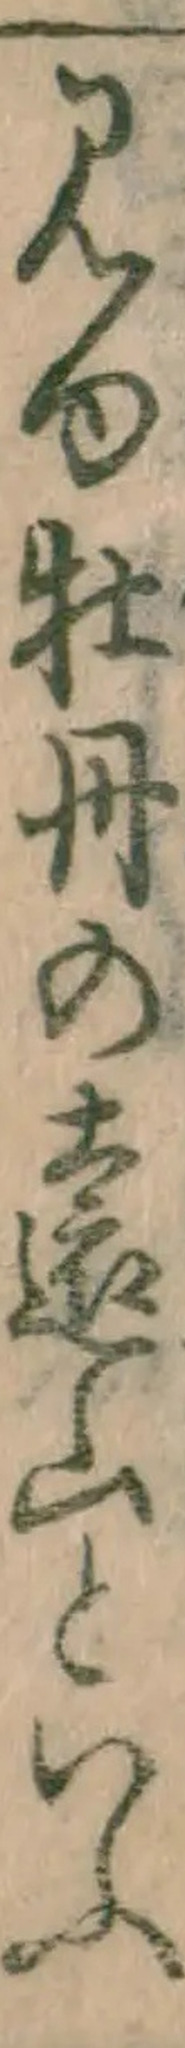見ゆ牡丹の遠山といふ
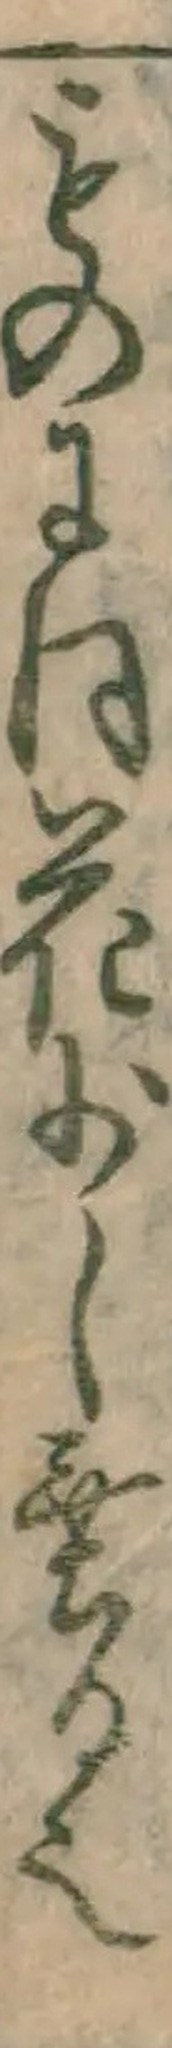ものに同花少し垂る也

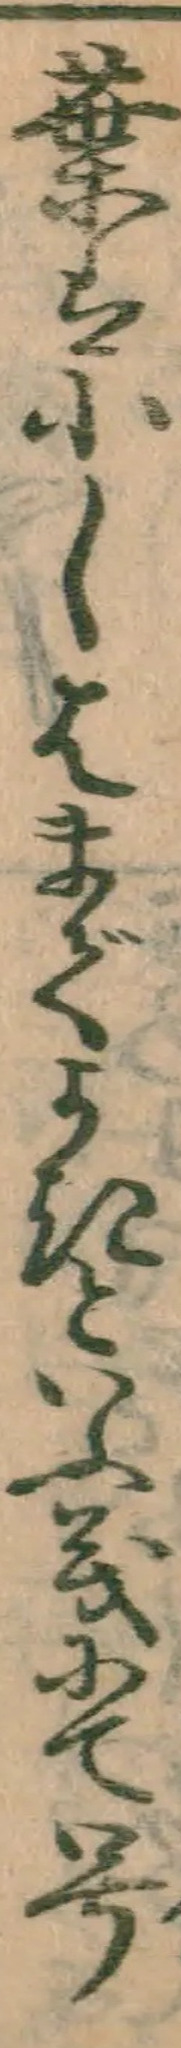葉は小しはまでよきといふ義にて号
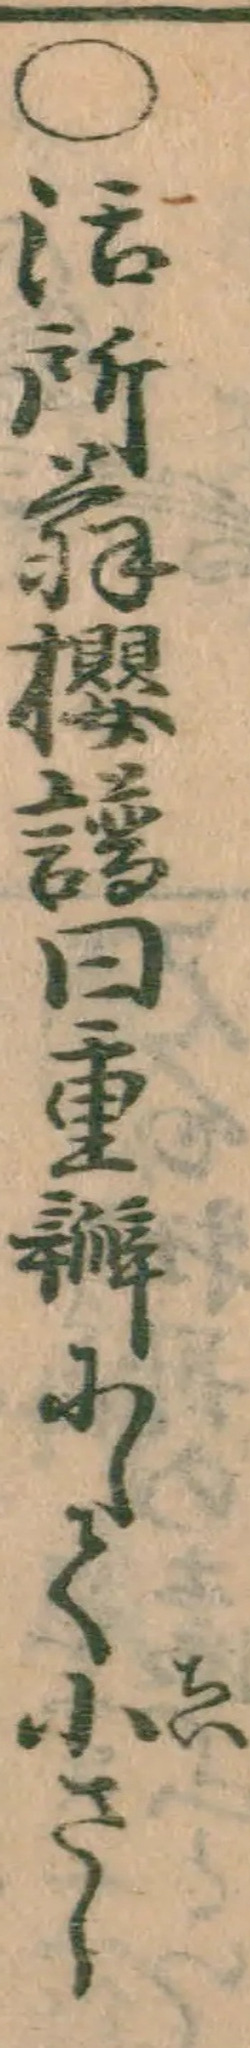○活所翁桜譜曰重弁にして小さし
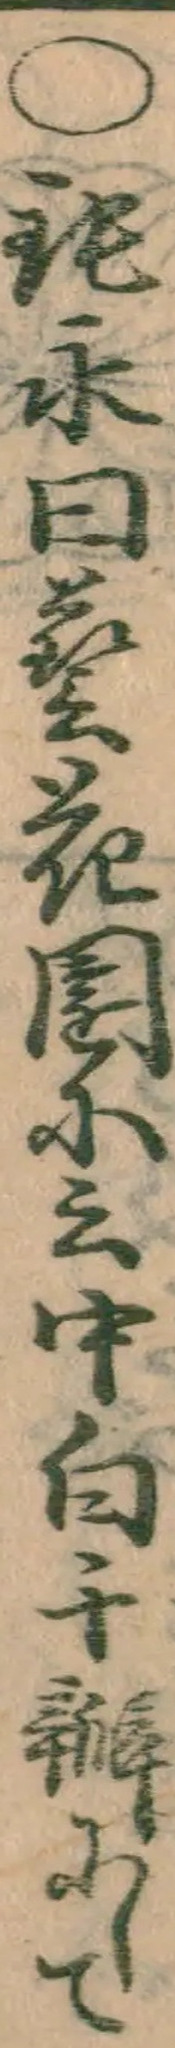○鈍永曰芸花園に云中白千弁にして
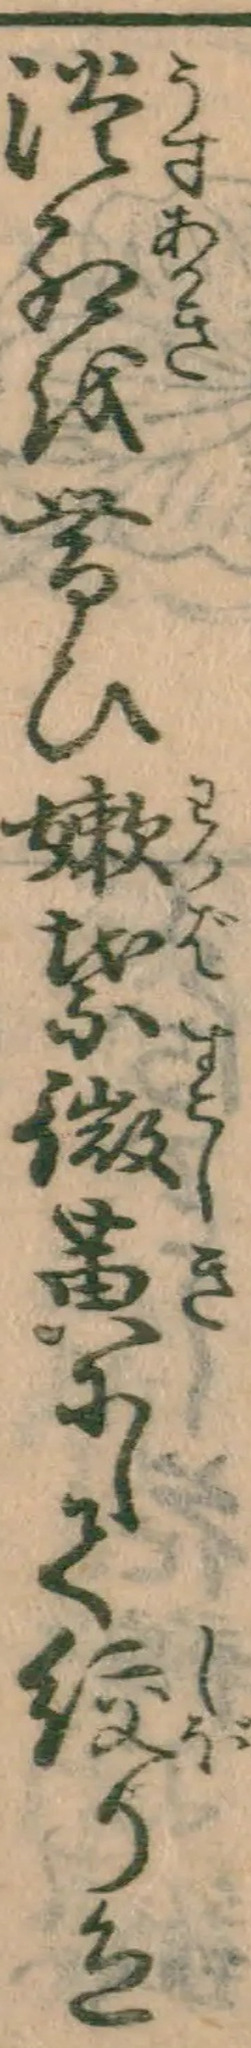淡紅を帯ひ嫩葉微黄にして絞り色
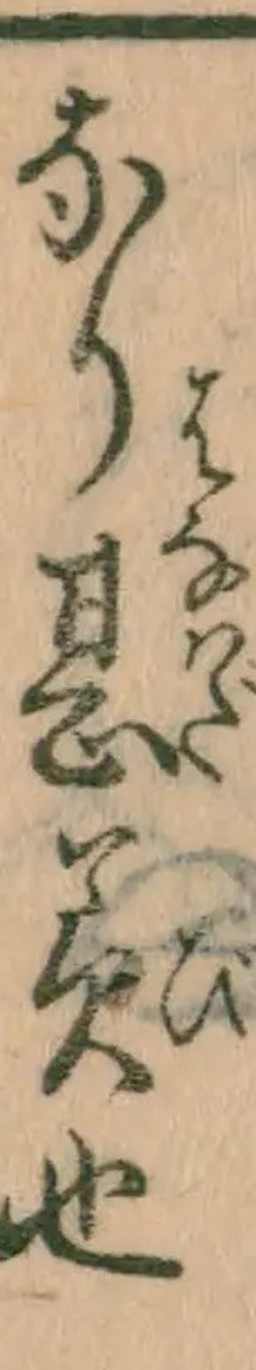なり甚美也
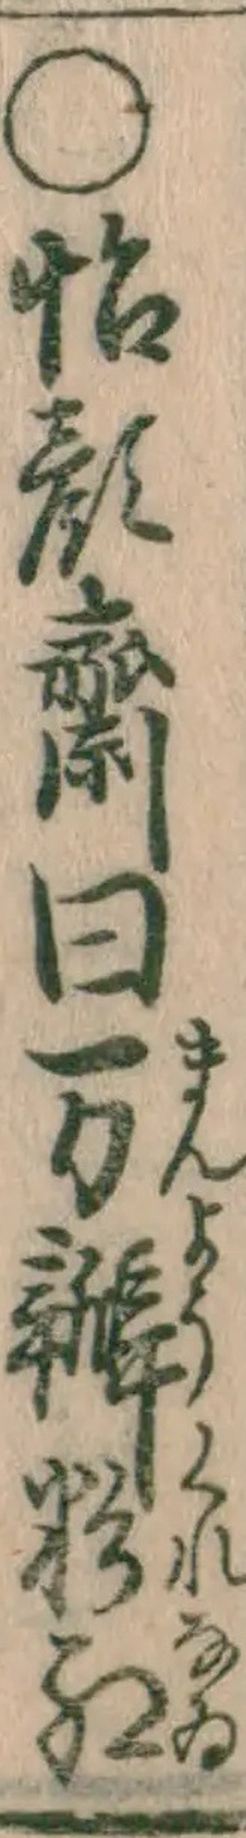○怡顔斎曰万弁粉紅
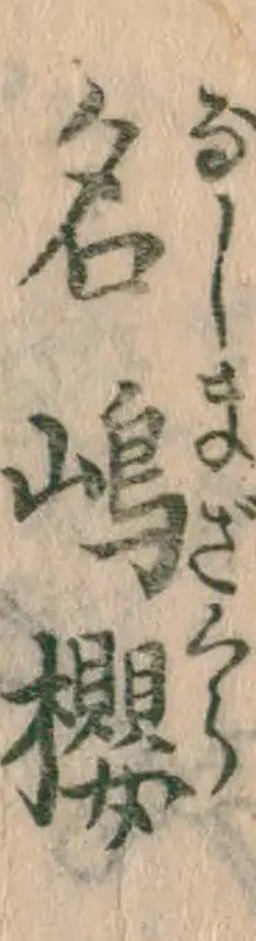名島桜
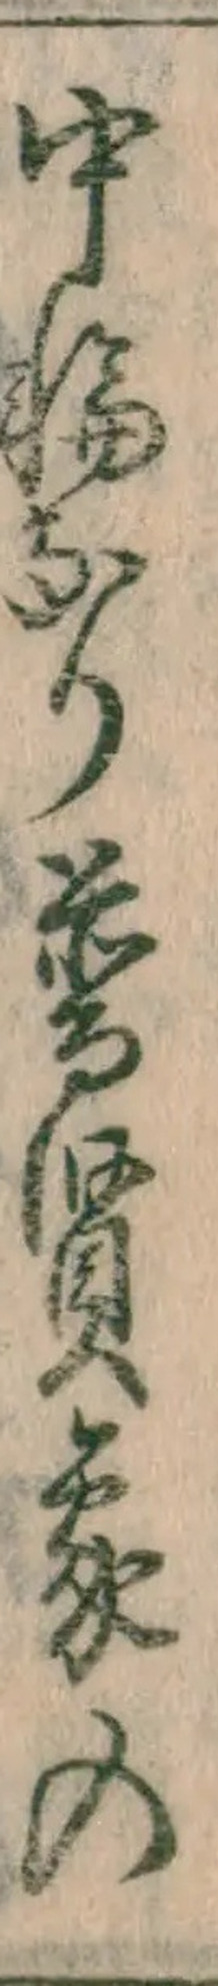中輪なり普賢象の
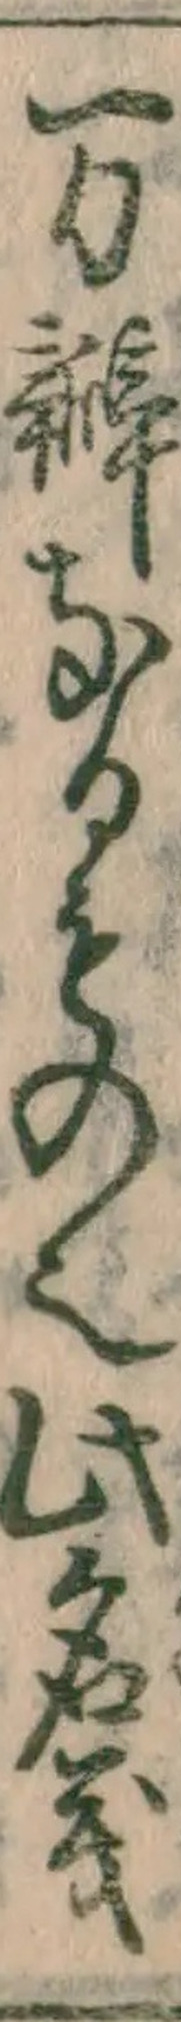万弁なるもの也此名義

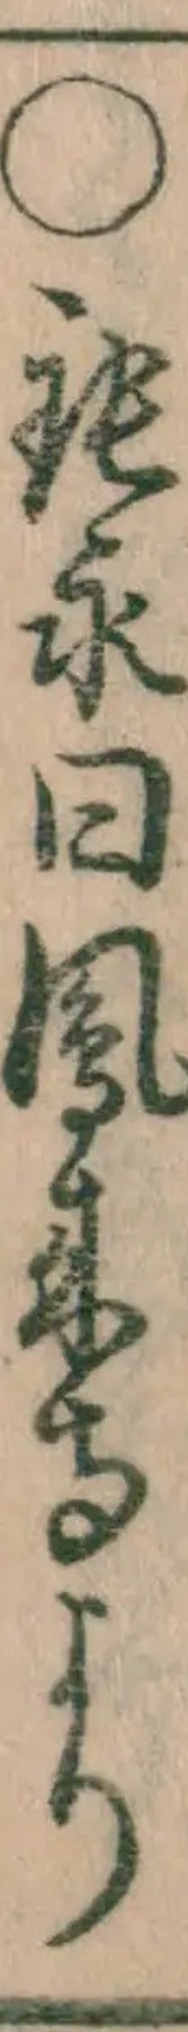○鈍永曰鳳来寺より
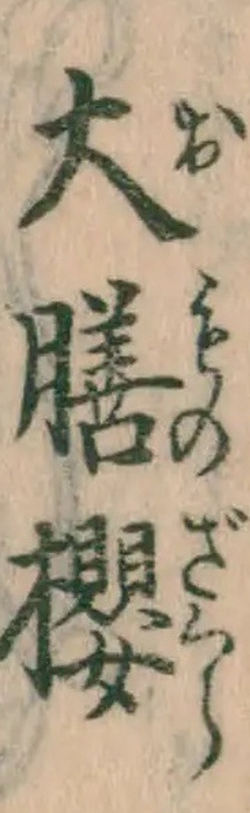大膳桜
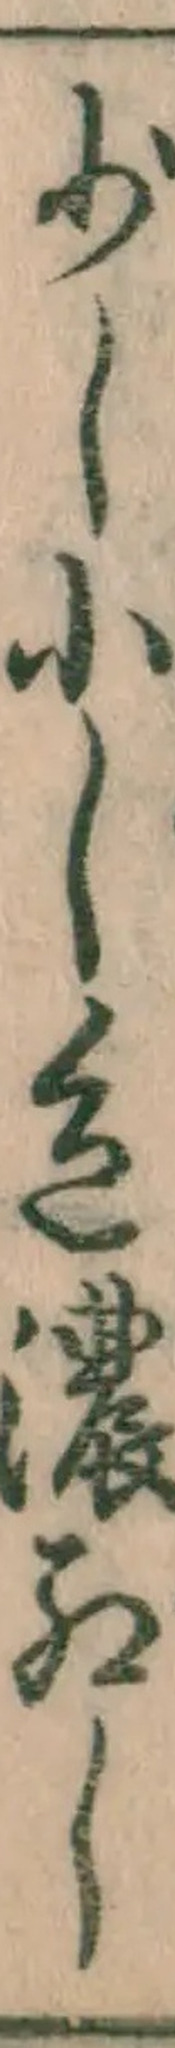少し小し色濃紅し
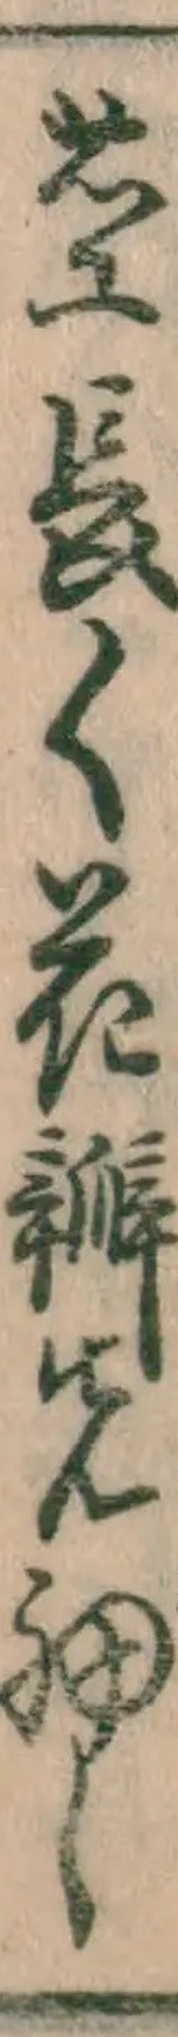茎長く花弁先細し
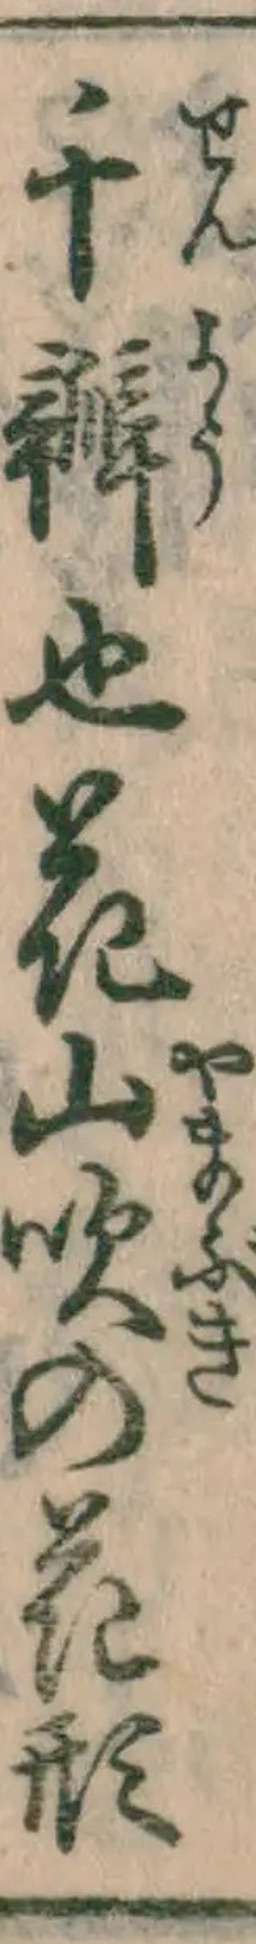千弁也花山吹の花形
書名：怡顔齋櫻品
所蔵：国立国会図書館 National Diet Library, JAPAN
